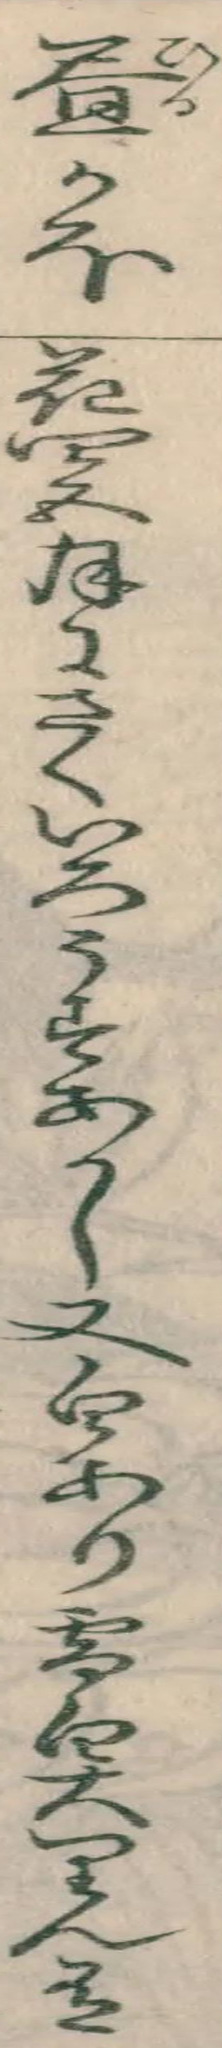[昼かほ]花四五月にさくいろうすあかし又白あり雪白大りん有
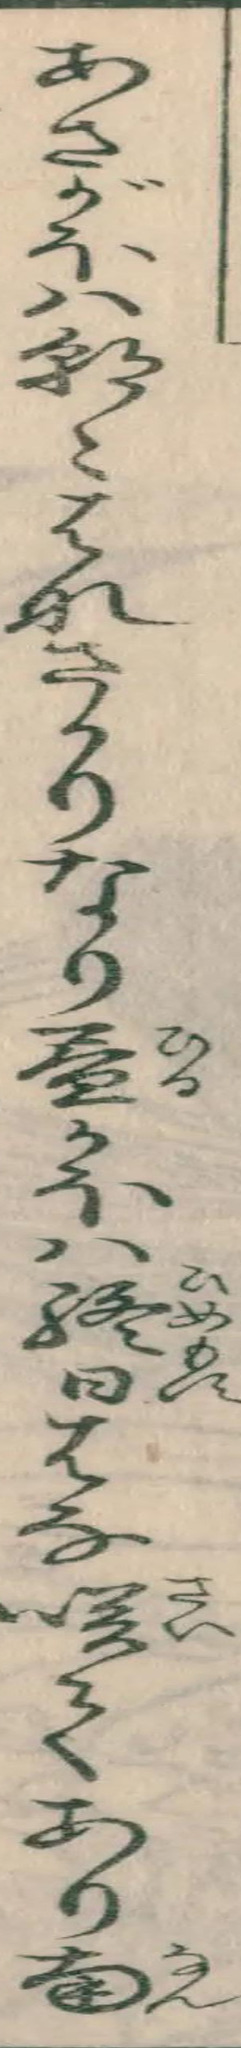あさがほは朝々はなさかりなり昼かほは終日はな咲てあり南
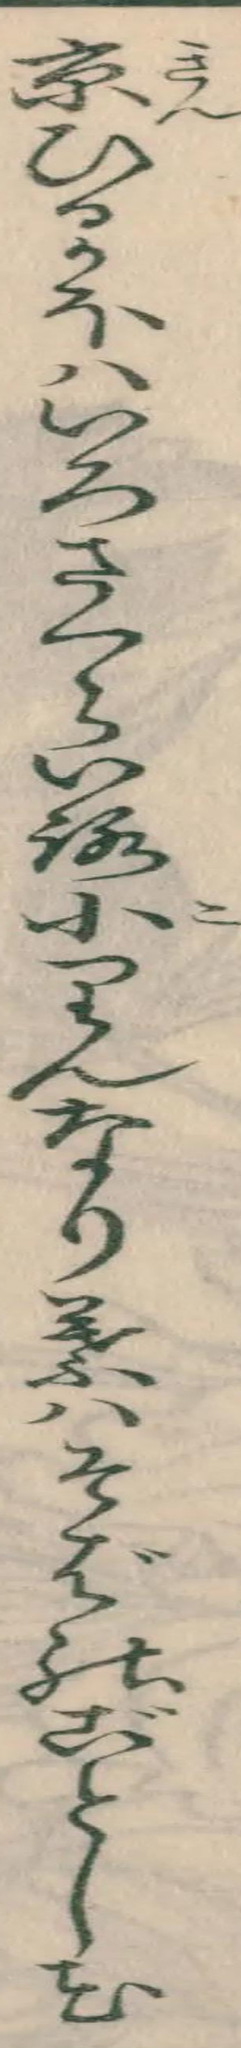京ひるかほはいろさくらいろ小りんなり葉はそばのごとし花
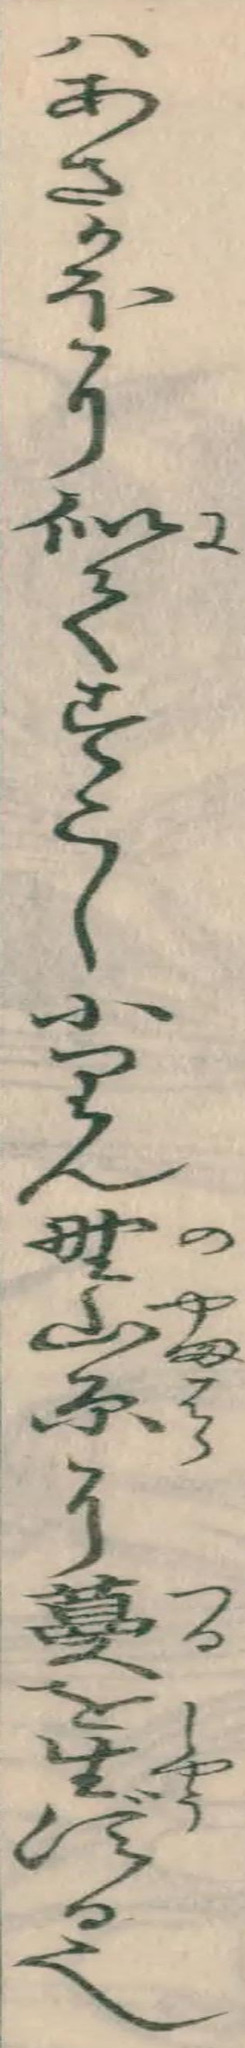はあさかほに似てすこし小りん野山原に蔓を生ずる也
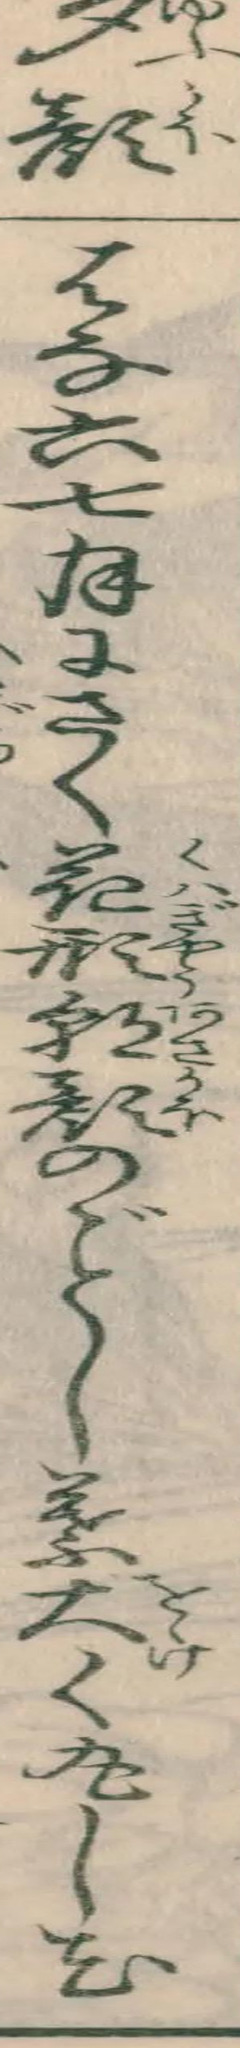[夕顔]はな六七月にさく花形朝顔のごとし葉大く丸し花
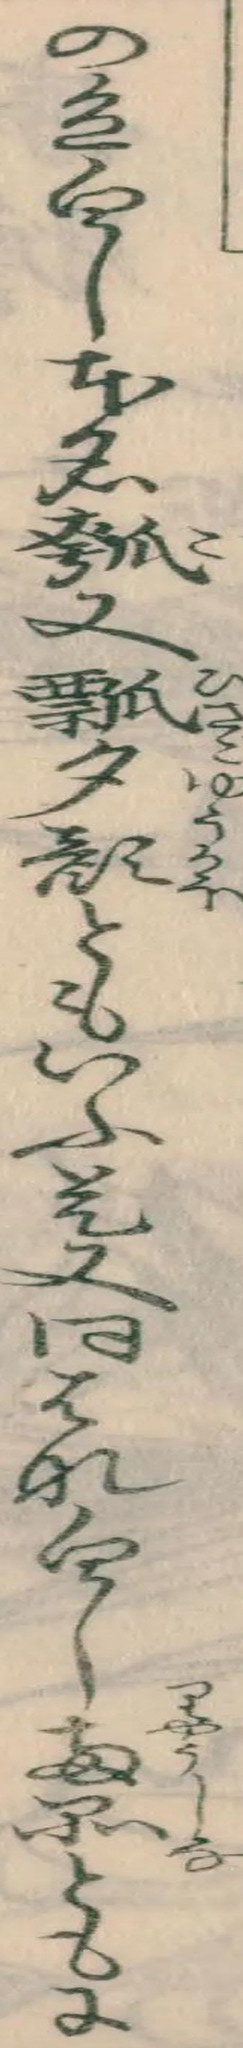の色白し本名瓠又瓢夕顔ともいふ是又同はな白し両品ともに
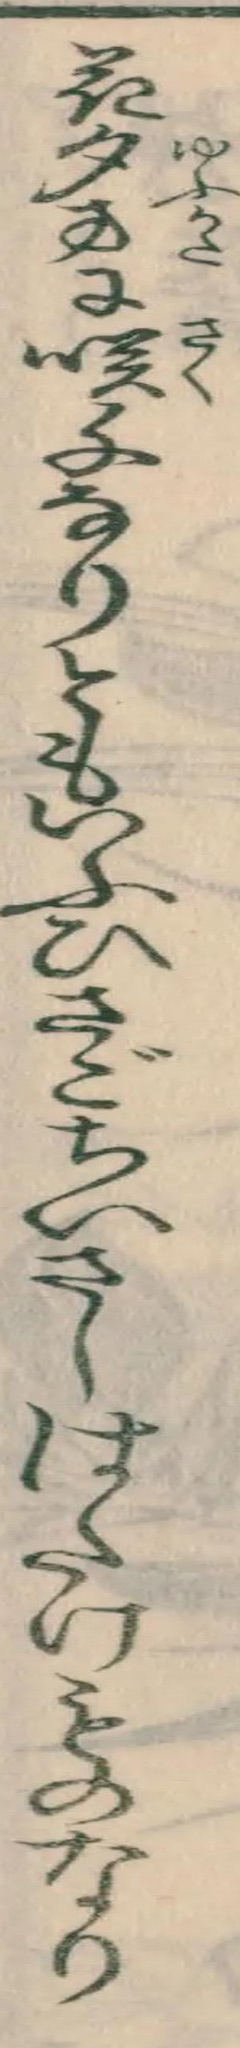花夕方に咲千なりともいふひさごちいさしはたけものなり
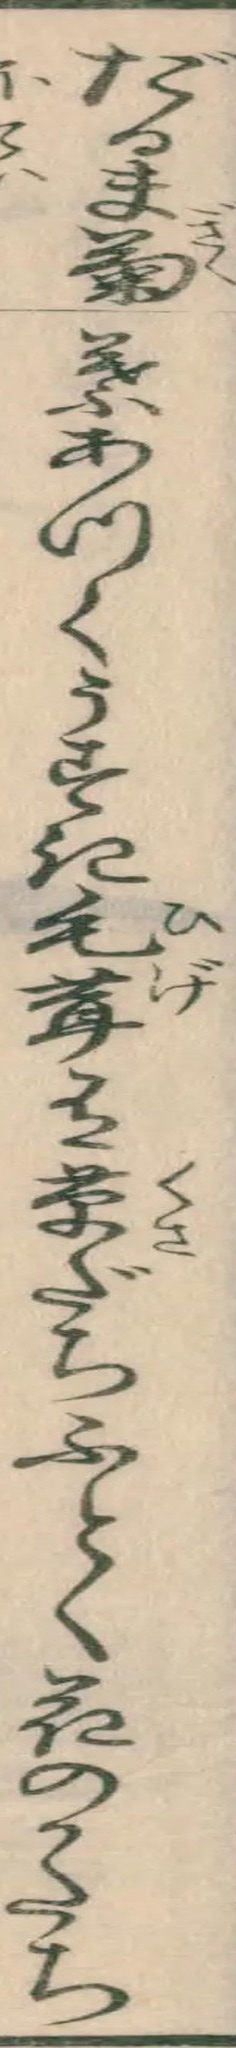葉あつくうすき毛茸有草だちふとく花のかたち
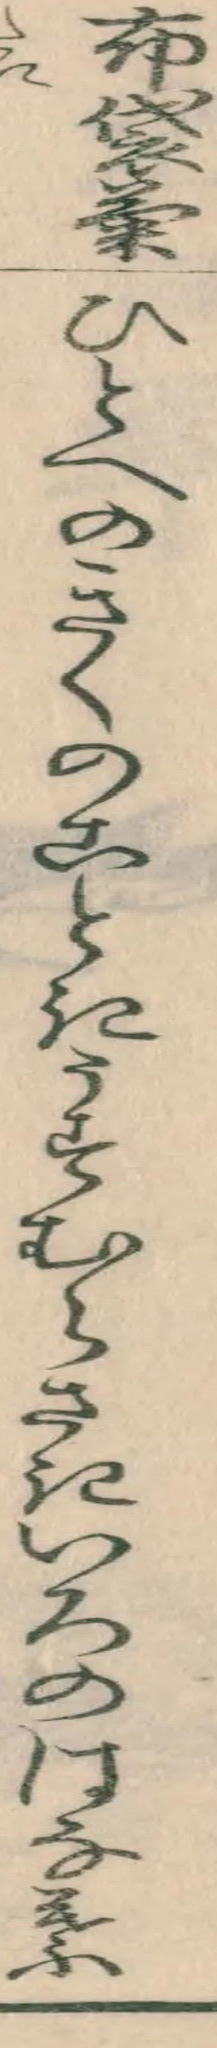ひとへのきくのこときうすむらさきいろのはな葉
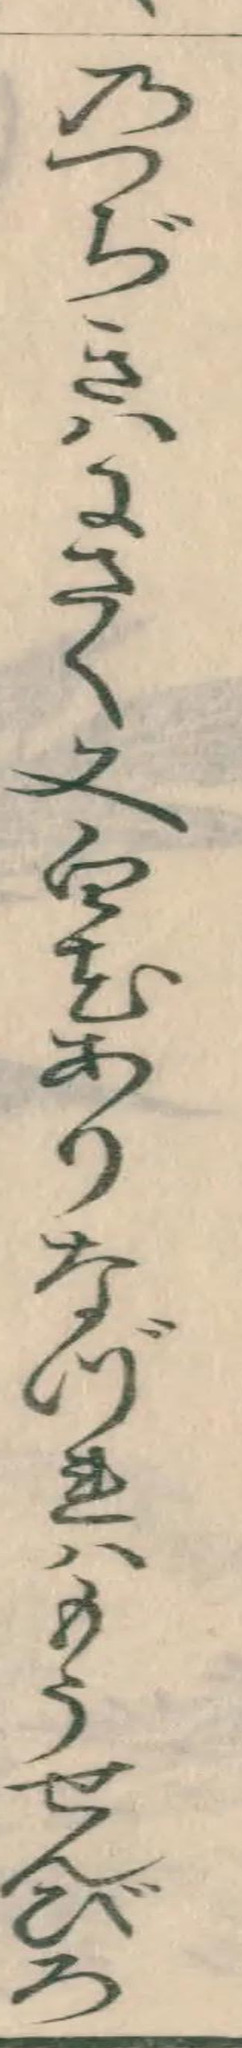のつぢきはにさく又白花ありなづれはもうせんびろ
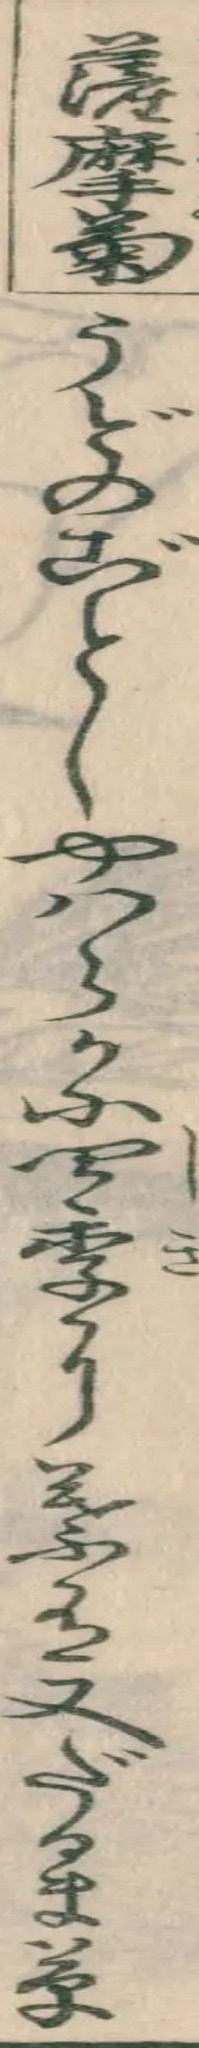うどのごとしやはらかに四季に葉有又だるま草
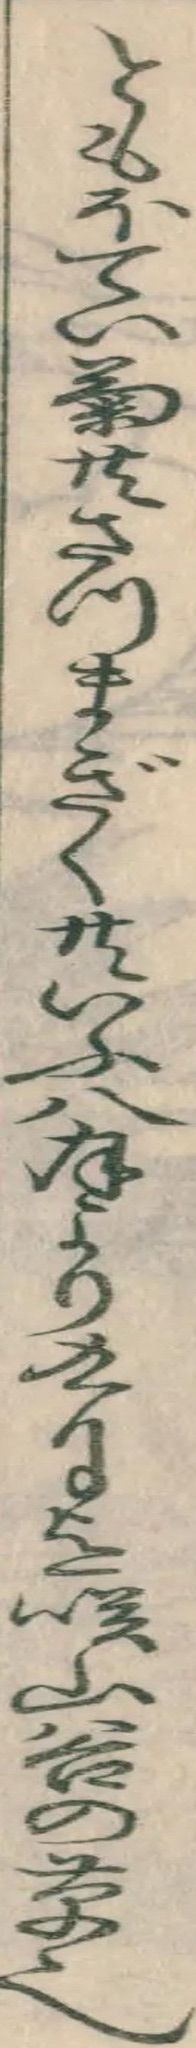ともほてい菊共さつまぎく共いふ八月より九月迄咲山谷の草也
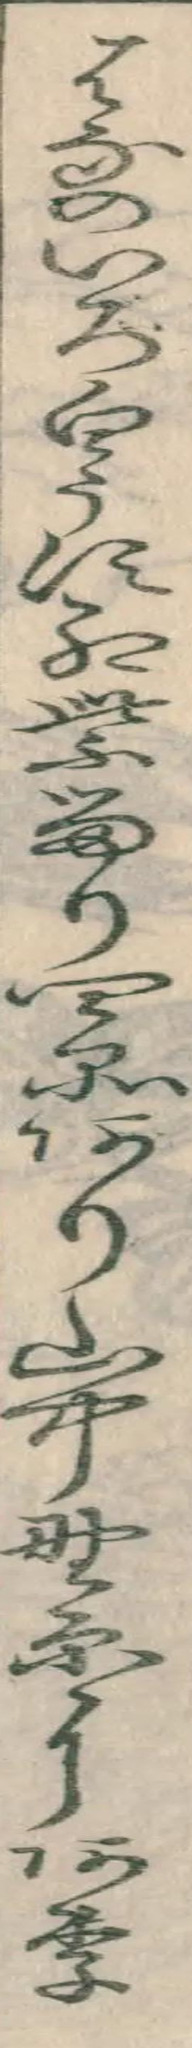はなのいろ白うす紅紫るり四品あり山中野原にあり
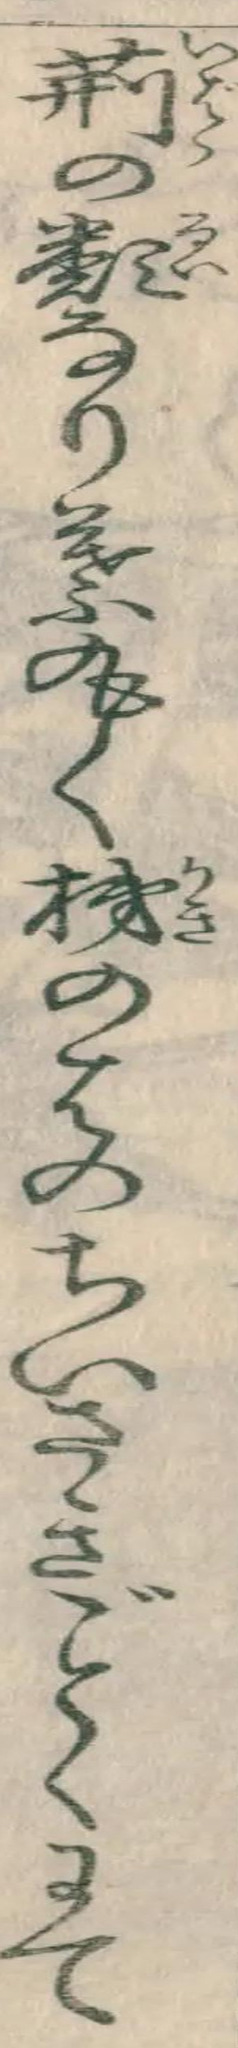荊の類なり葉丸く柿のはのちいさきごとくにて
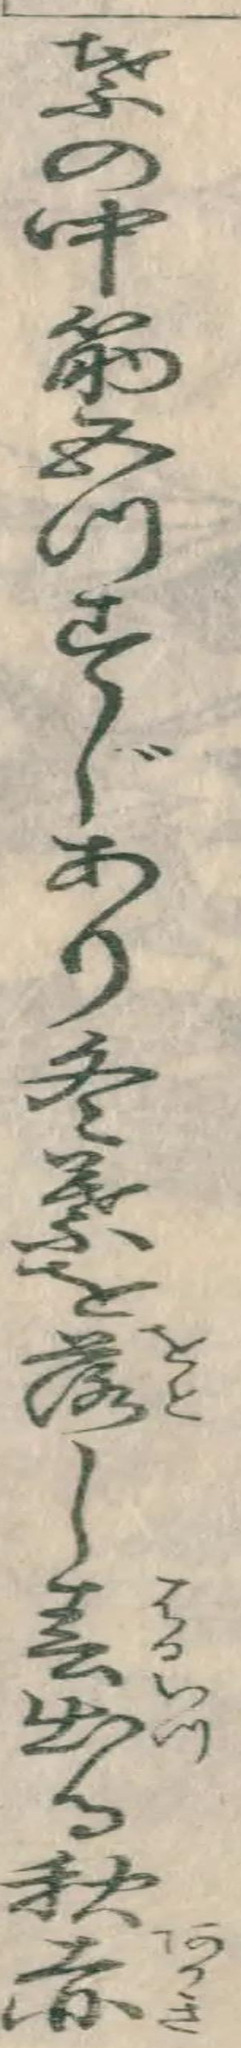葉の中筋五つすじあり冬葉を落し春出る秋赤
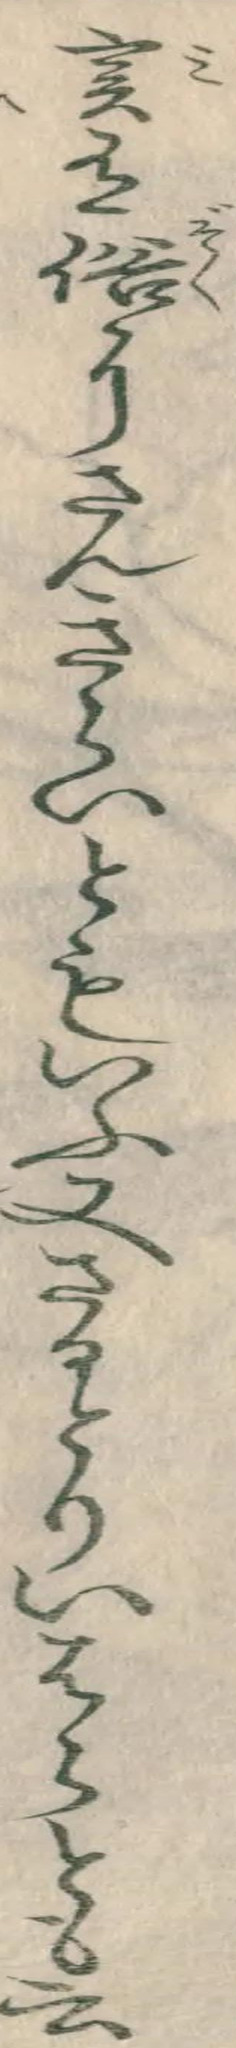実有俗にさんきらいともいふ又さるとりいはらとも云
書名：畫本野山草. [4]
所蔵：国立国会図書館 National Diet Library, JAPAN
